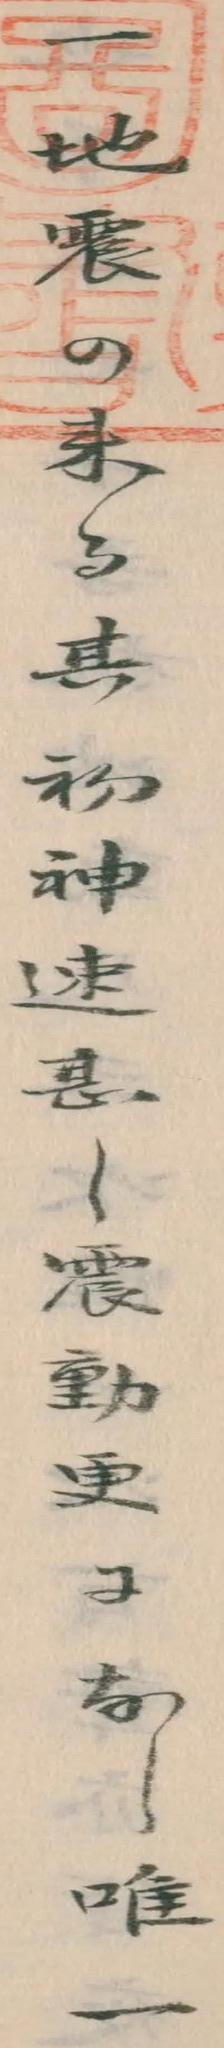一地震の来る其初神速甚し震動更になし唯一
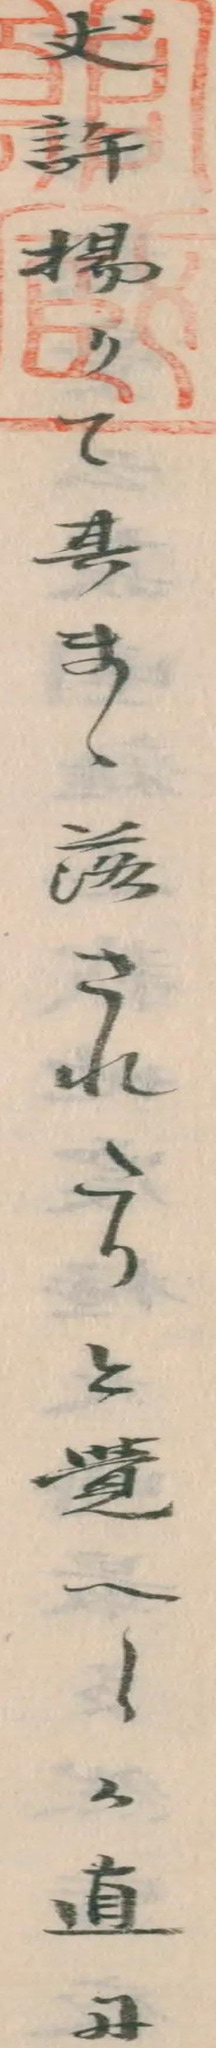丈許揚りて其まゝ落されたりと覚へしか直に
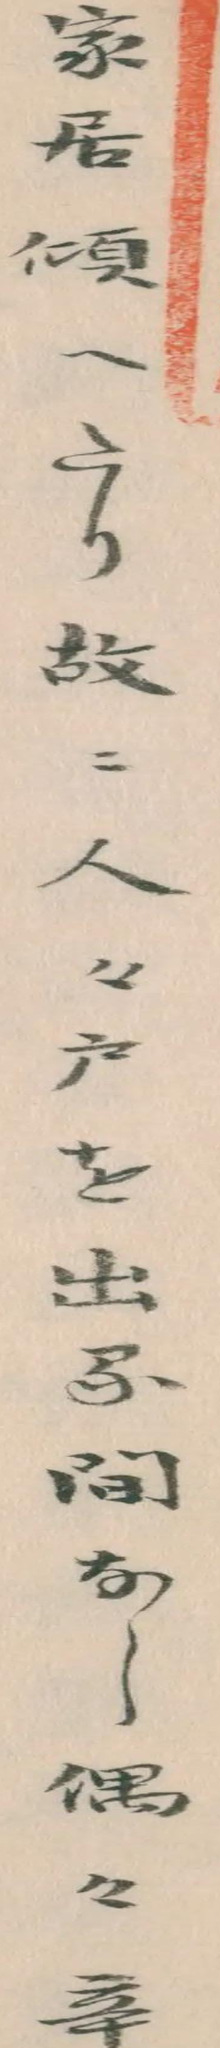家居傾へたり故に人々戸を出る間なし偶々辛
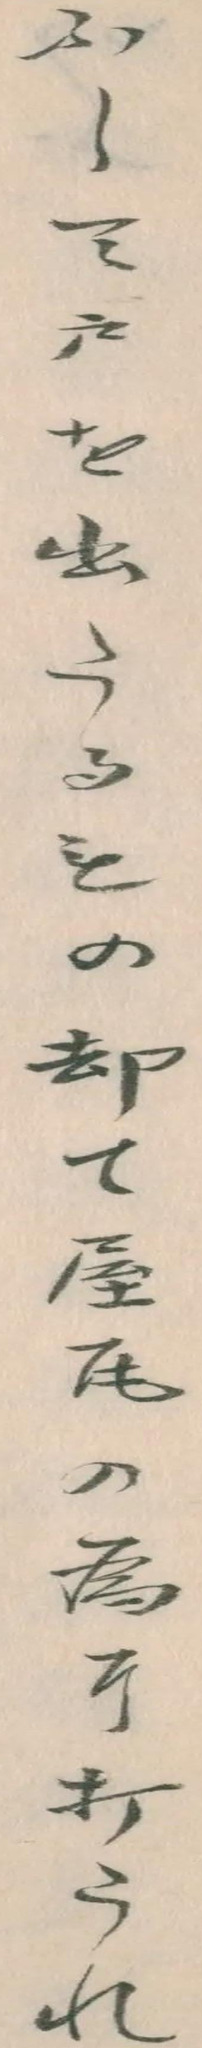ふして戸を出たるもの却て屋瓦の為に打たれ
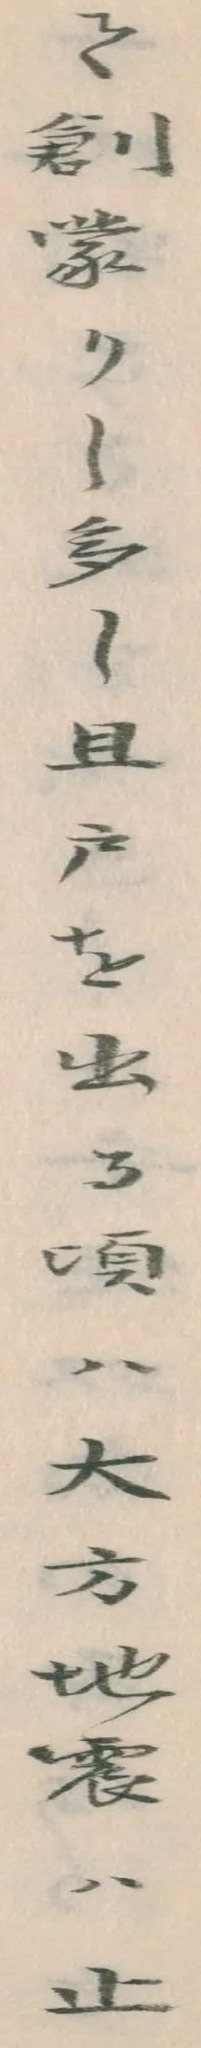て創蒙りし多し且戸を出る頃は大方地震は止
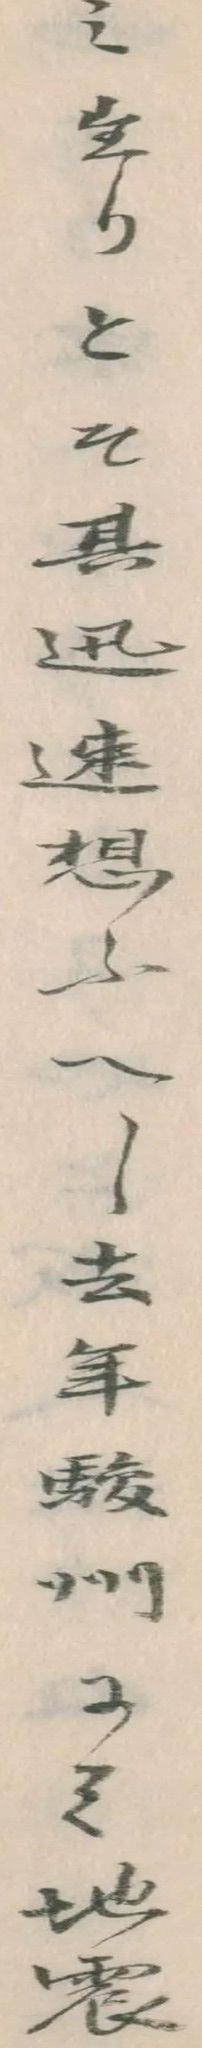みたりとそ其迅速想ふへし去年駿州にて地震
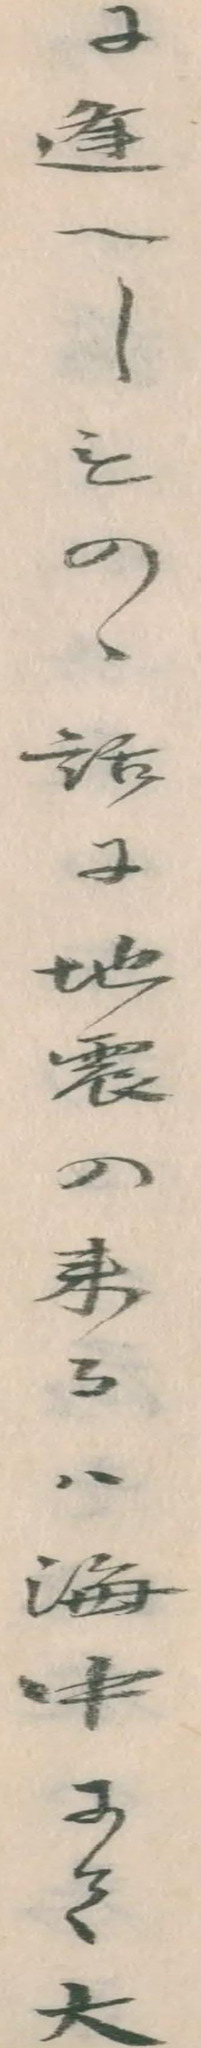に逢へしものゝ話に地震の来るは海中にて大
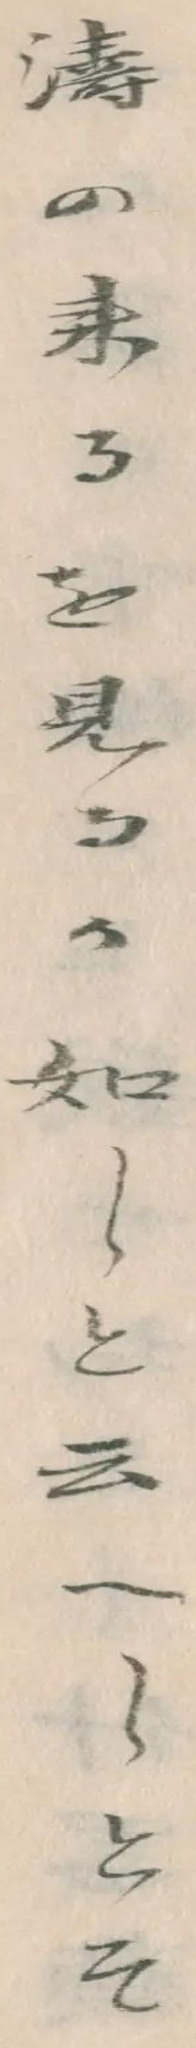濤の来るを見るか如しと云へしとそ
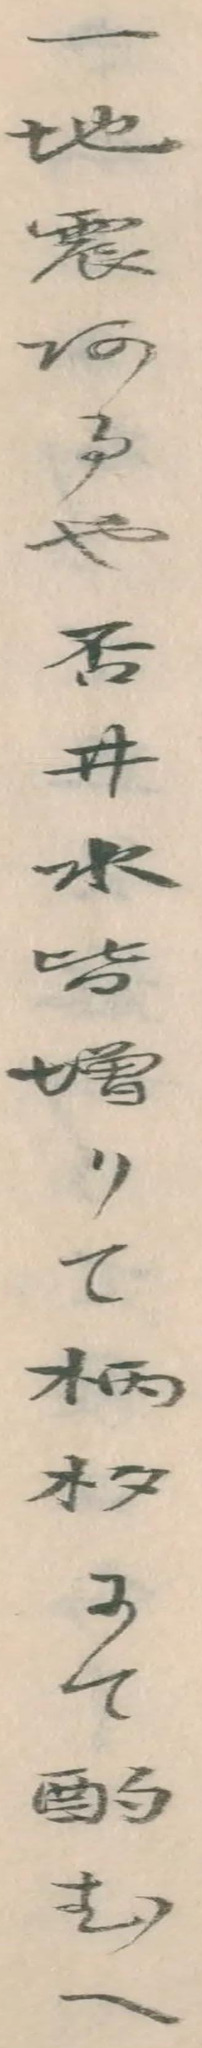一地震あるや否井水皆増りて柄杓にて酌むへ

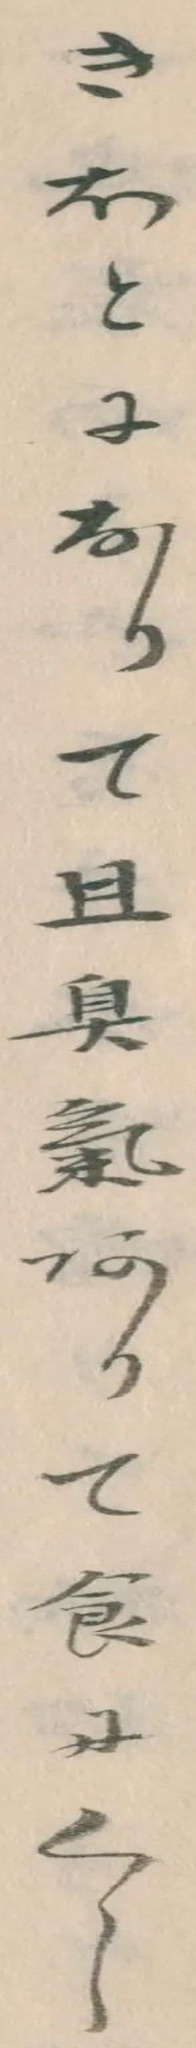きほとになりて且臭氣ありて食にくし
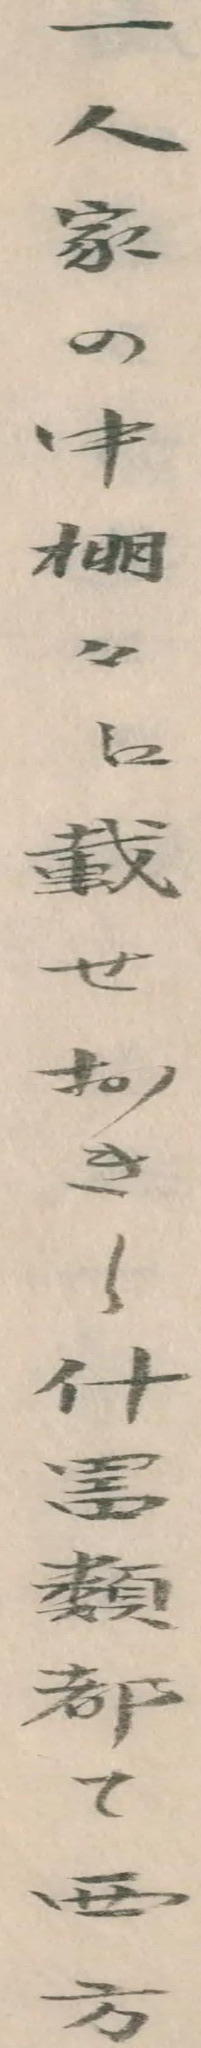一人家の中棚々江載せおきし什器類都て西方
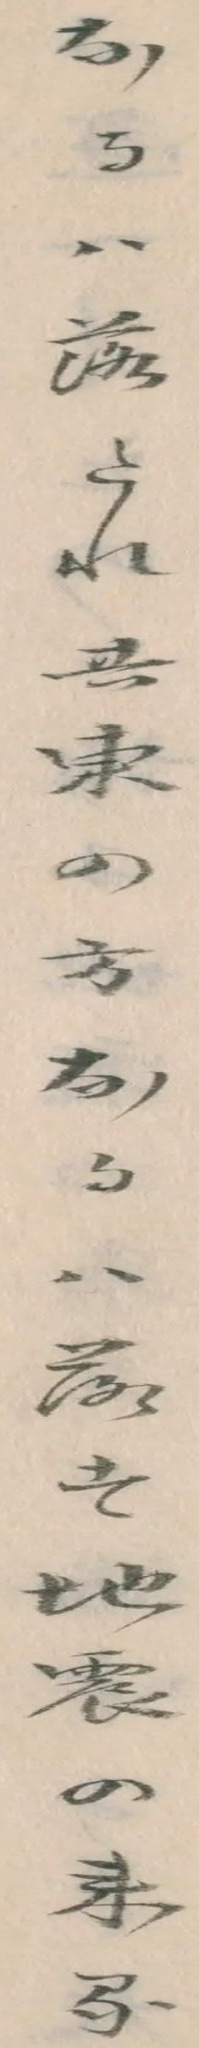なるは落たれ共東の方なるは落す地震の来る
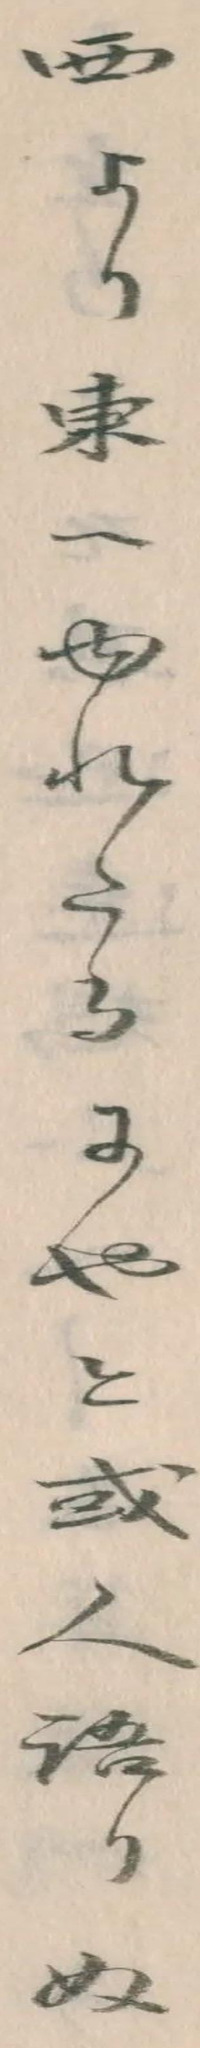西より東へゆれたるにやと或人語りぬ
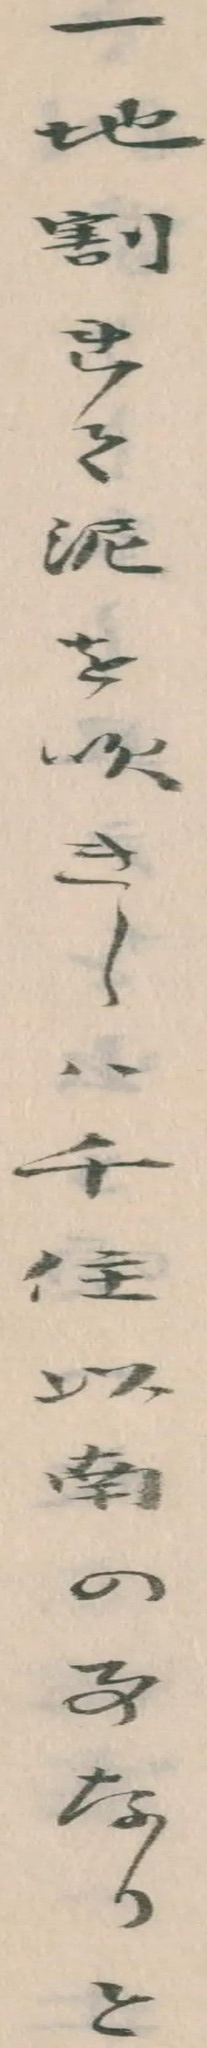一地割れて泥を吹きしは千住以南の事なりと
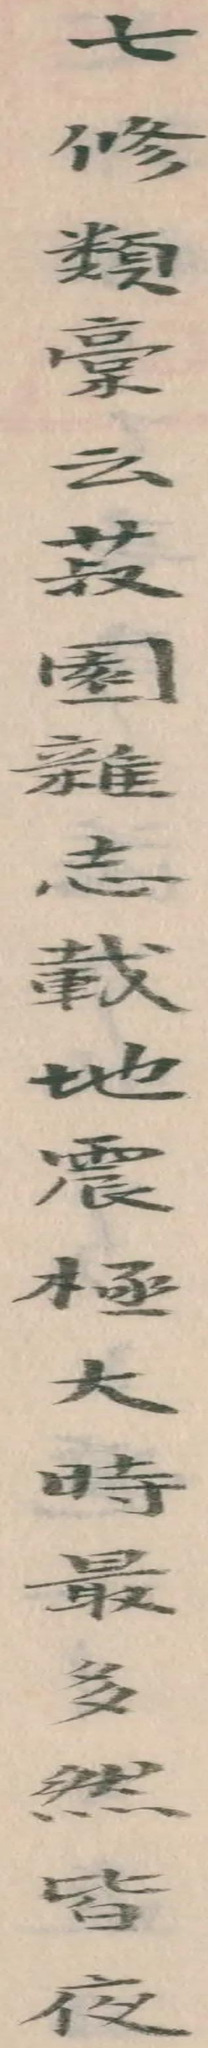七修類槀云菽園雜志載地震極大時最多然皆夜
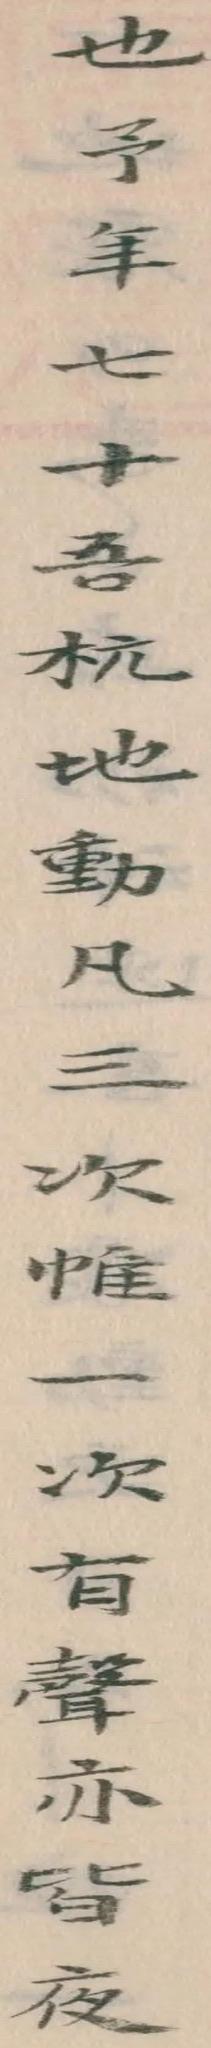也予年七十吾杭地動凡三次帷一次有聲亦皆夜
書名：地災撮要. 巻11-12(地震之部)
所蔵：国立国会図書館 National Diet Library, JAPAN
